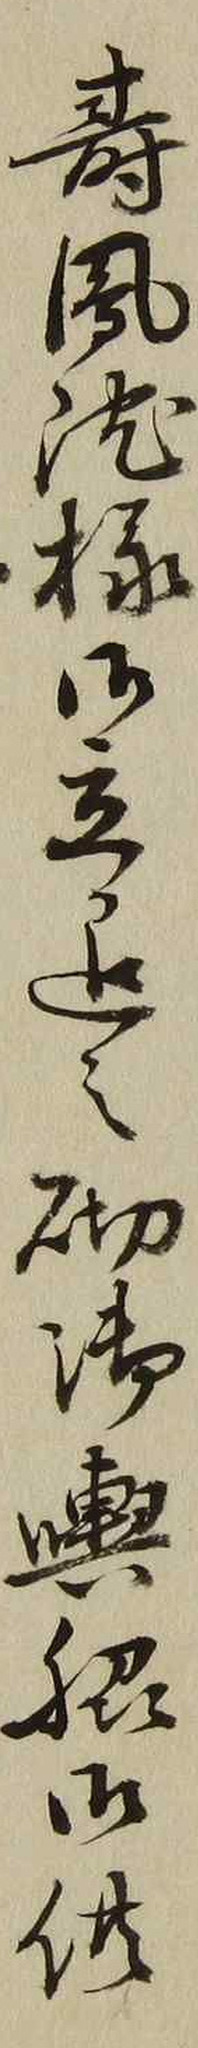寿鳳院様御立退之砌御輿脇御供
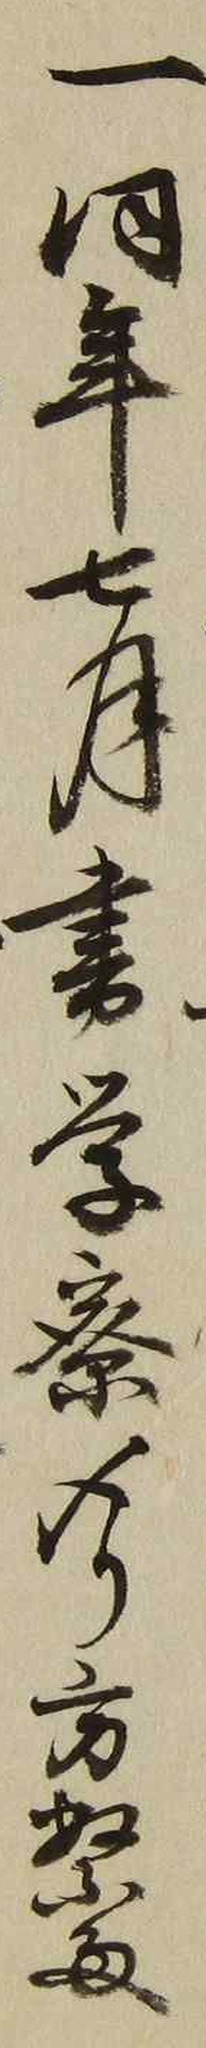一同年七月書学寮〆り方繁多
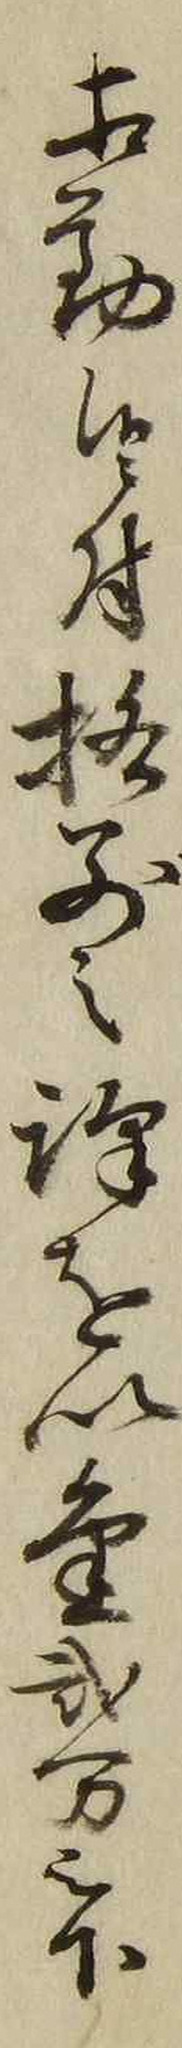相勤候ニ付格別之訳を以金弐分被下
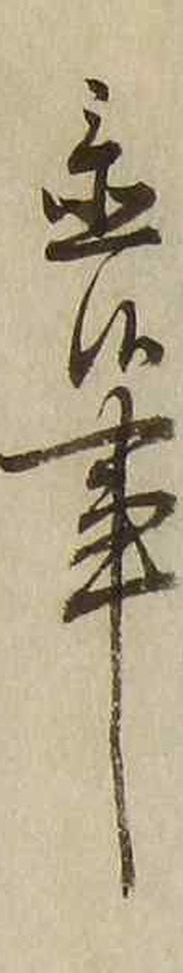置候事

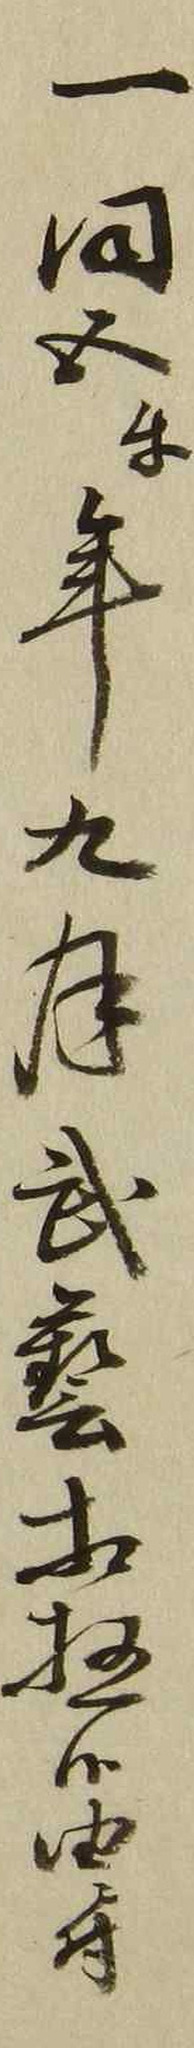一同五午年九月武芸相極候由ニ付
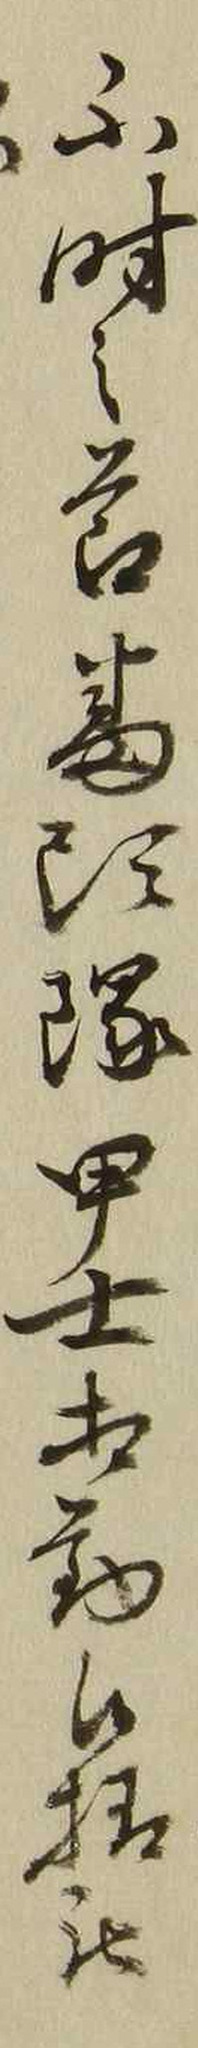不時之節番頭隊甲士相勤候様被
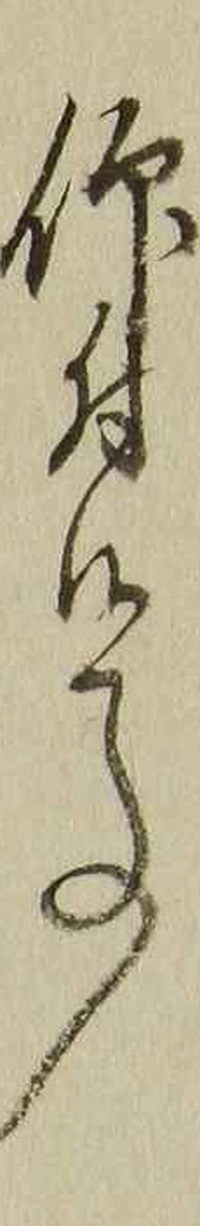仰付候事
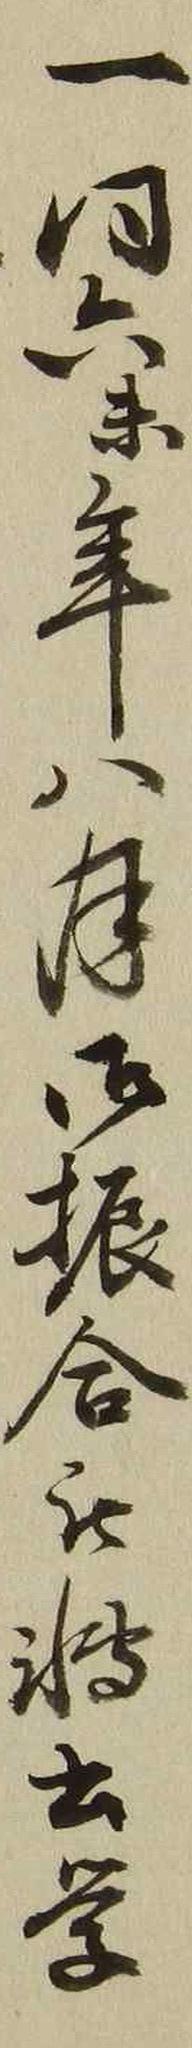一同六未年八月御振合被転書学
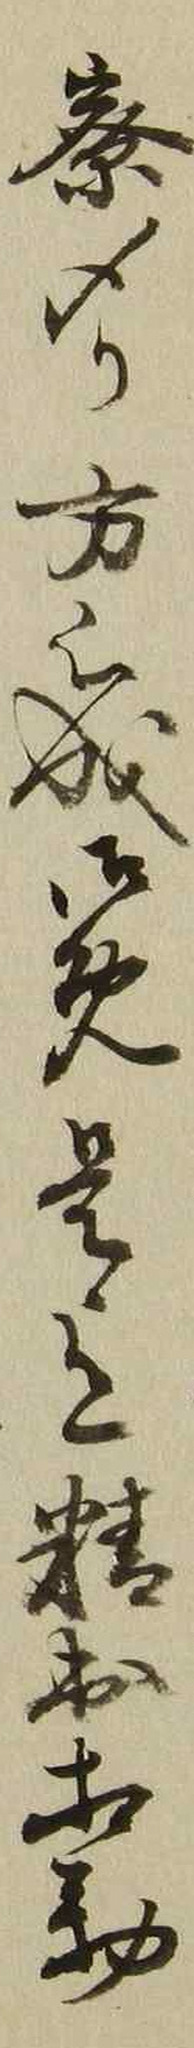寮〆り方被成御免是迄精出相勤
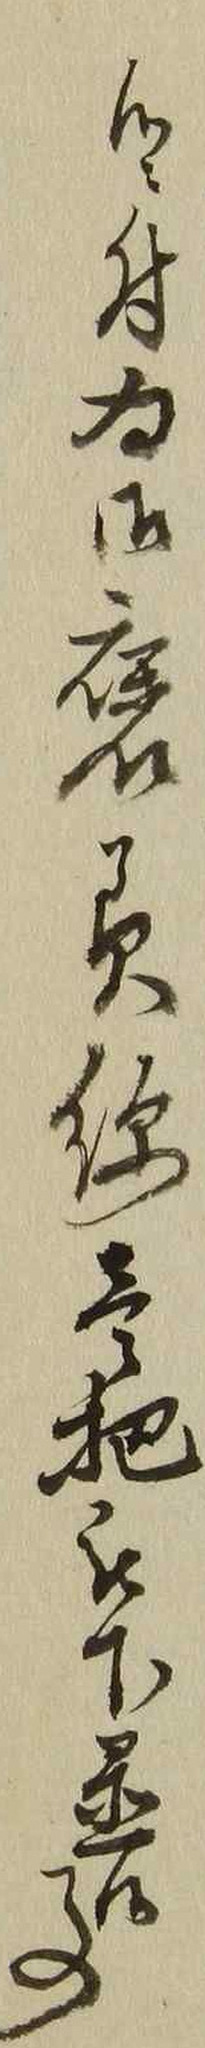候ニ付為御褒美綿壱把被下置候事
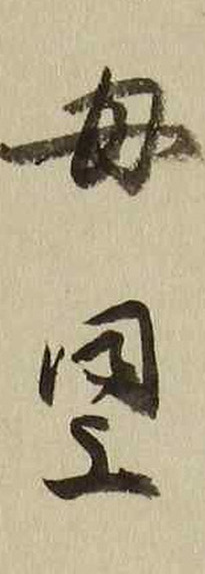母同上
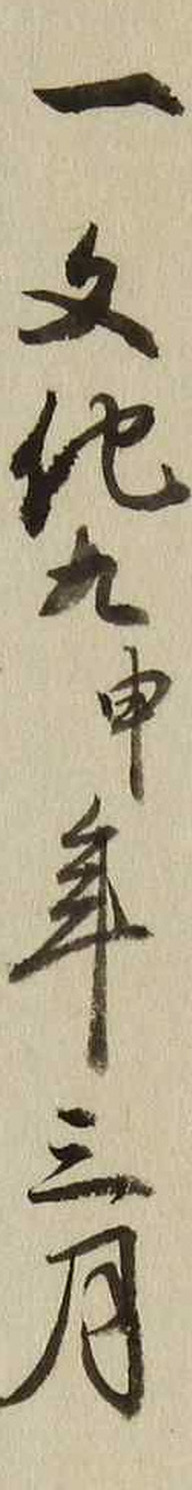一文化九申年三月
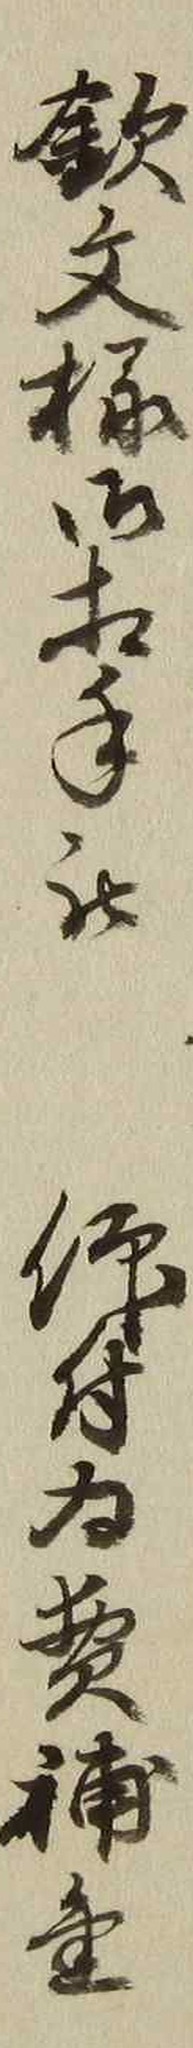欽文様御相手被仰付為費補金
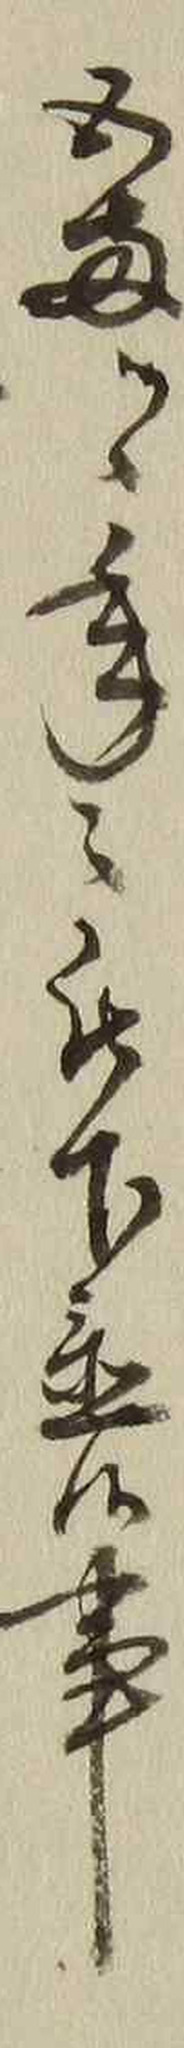五両ツヽ年々被下置候事
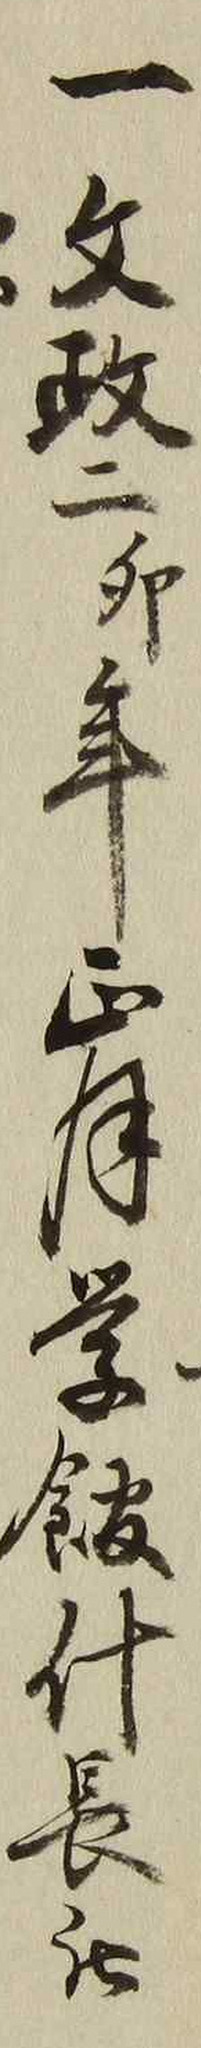一文政二卯年正月学館什長被
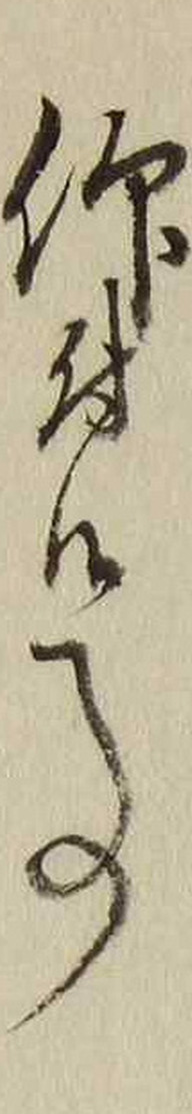仰付候事
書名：諸士系譜　巻之35　は之部3
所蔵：会津若松市立会津図書館
